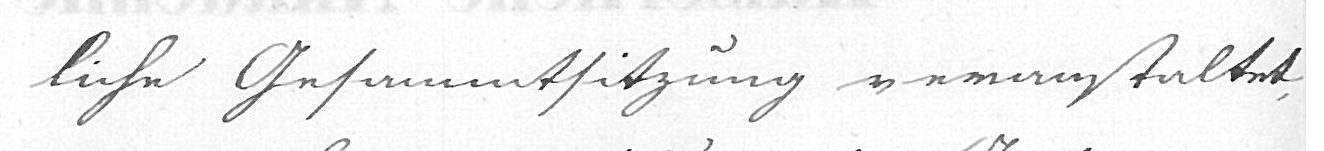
liche Gesammtsitzung veranstaltet,
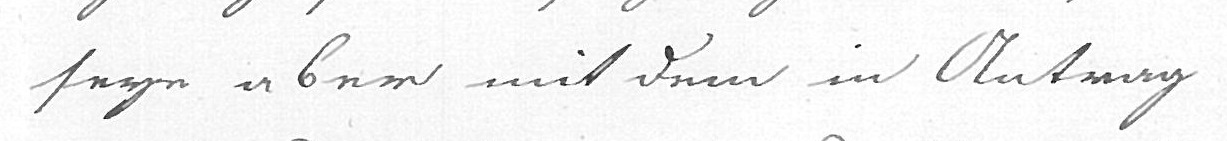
seye aber mit dem in Antrag
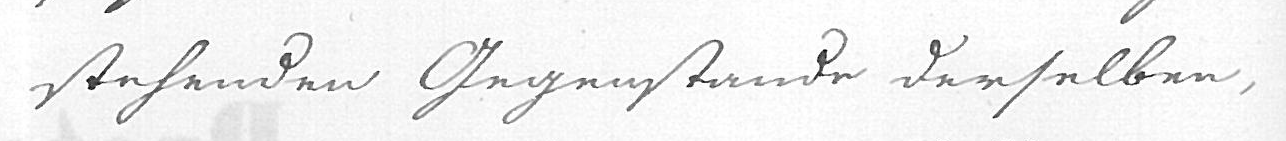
stehenden Gegenstande derselben,
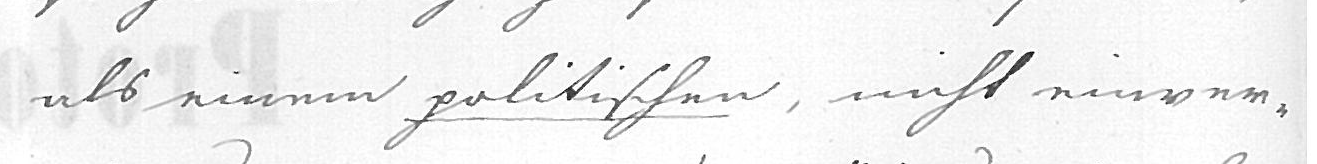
als einem politischen, nicht einver-
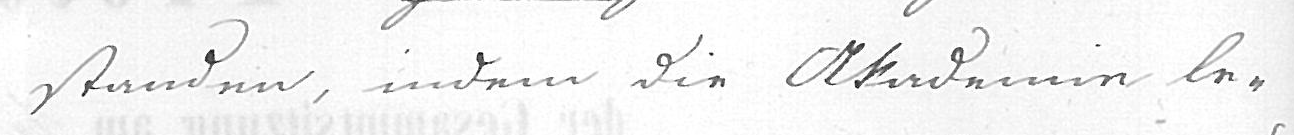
standen, indem die Akademie le-
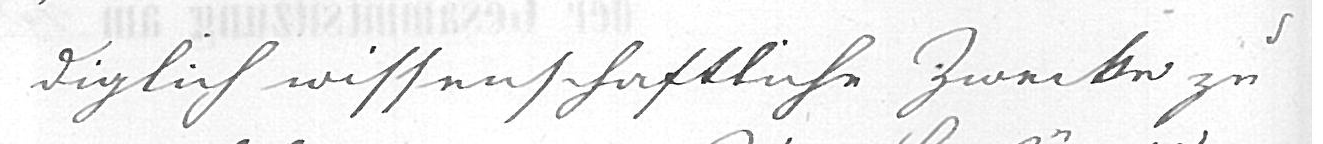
diglich wissenschaftliche Zwecke zu
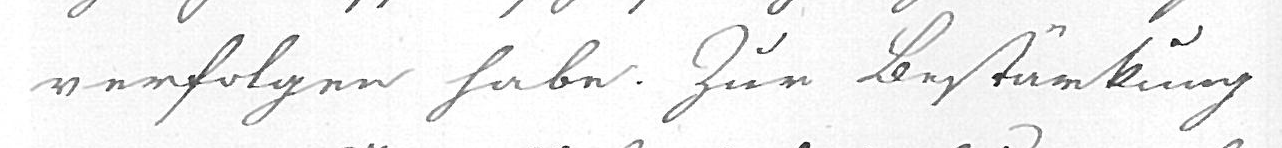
verfolgen habe. Zur Bestärkung
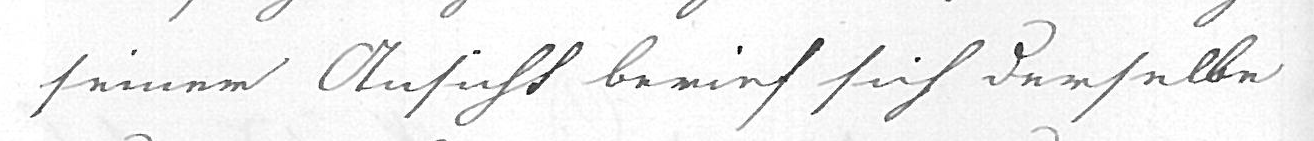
seiner Ansicht berief sich derselbe
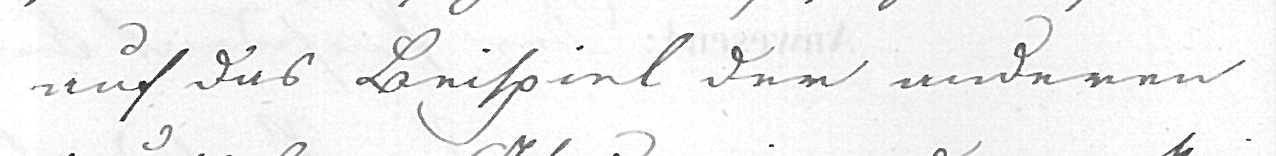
auf das Beispiel der anderen
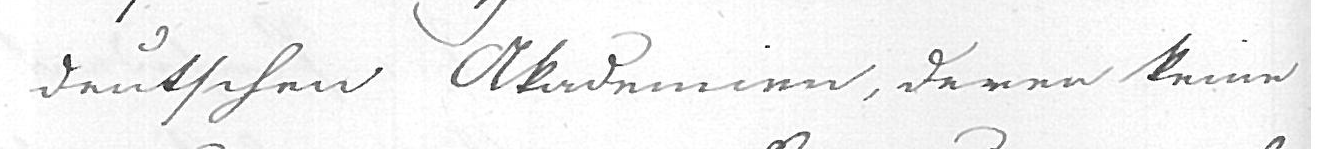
deutschen Akademien, deren keine
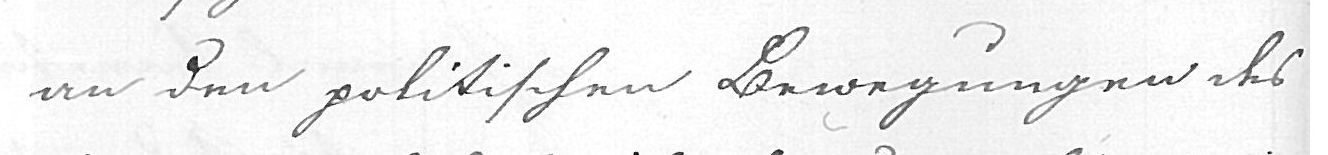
an den politischen Bewegungen des
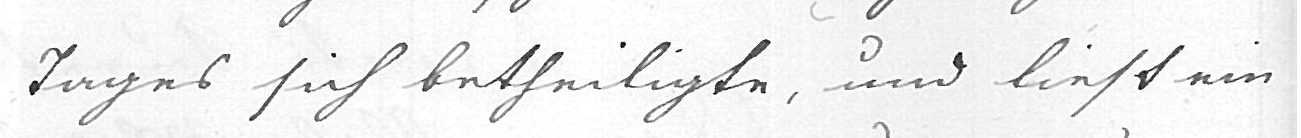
Tages sich betheiligte, und liest ein
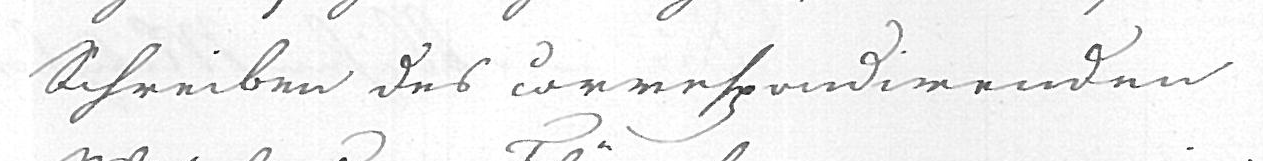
Schreiben des correspondirenden
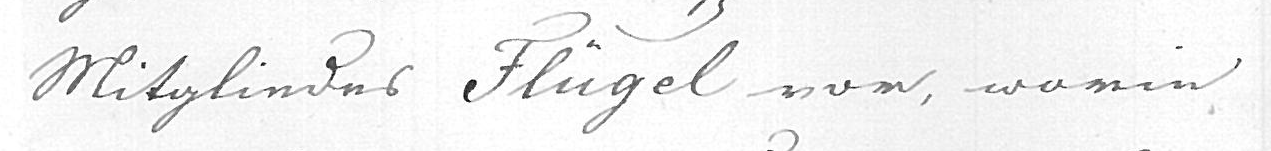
Mitgliedes Flügel vor, worin
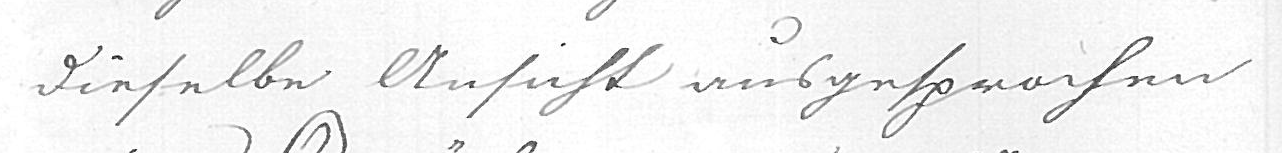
dieselbe Ansicht ausgesprochen
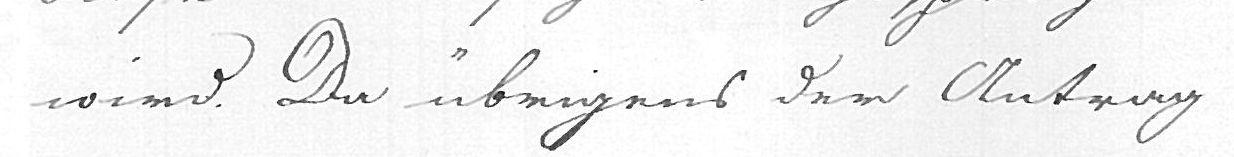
wird. Die übrigens der Antrag
